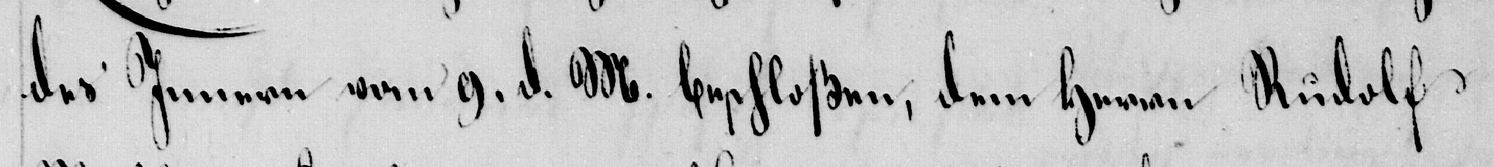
des Innern vom 9. d. M. beschloßen, dem Herrn Rudolf
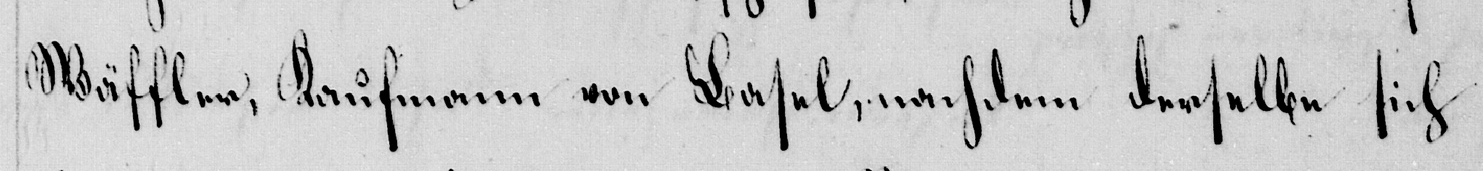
Wäffler, Kaufmann von Basel, nachdem derselbe sich
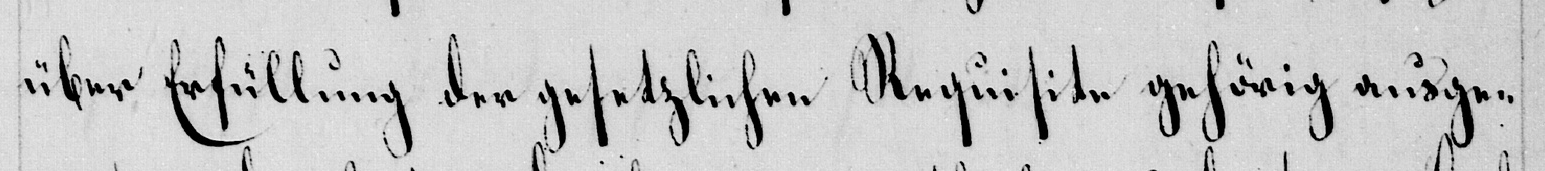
über Erfüllung der gesetzlichen Requisite gehörig ausge¬
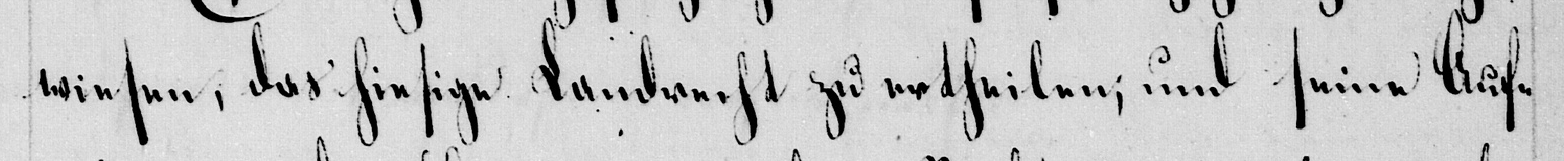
wiesen, das hiesige Landrecht zu ertheilen; und seine Auf¬
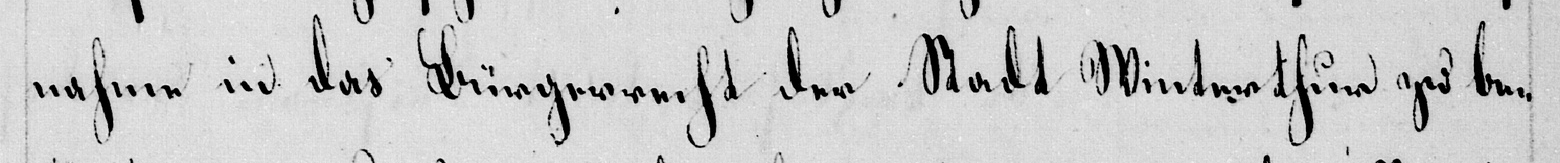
nahme in das Bürgerrecht der Stadt Winterthur zu be¬
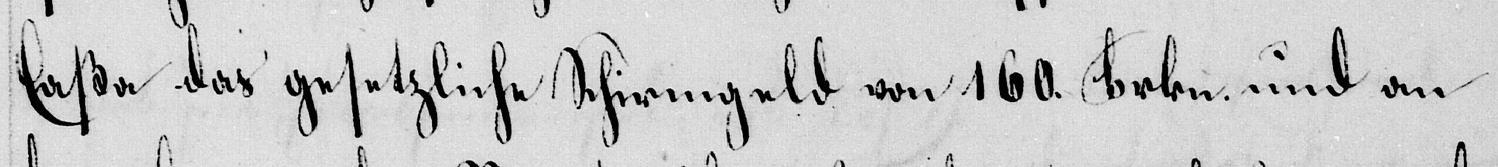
aßa das gesetzliche Schirmgeld von 160. Frkn. und an
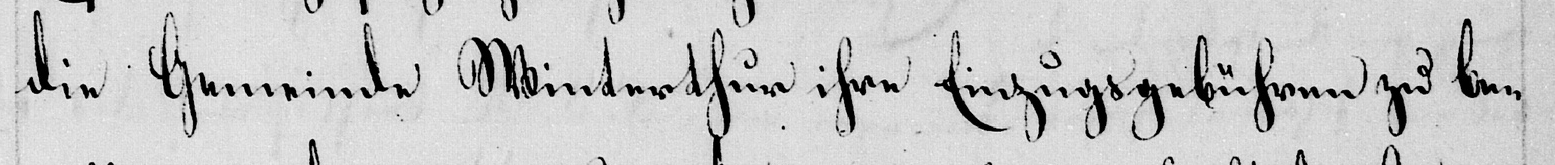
die Gemeinde Winterthur ihre Einzugsgebühren zu be¬
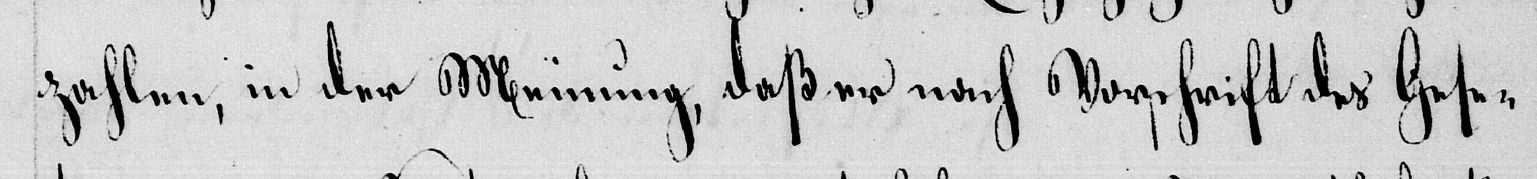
zahlen, in der Meinung, daß er nach Vorschrift des Gese¬
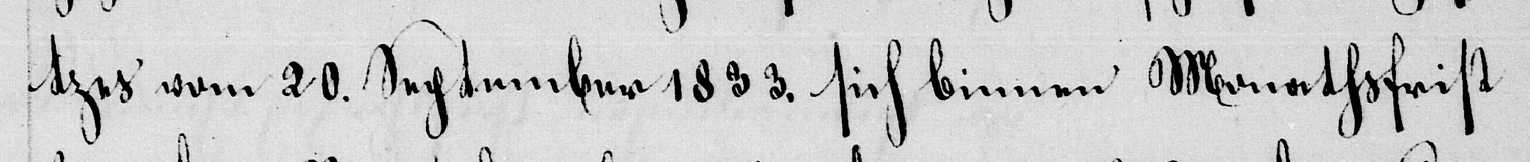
tzes vom 20. September 1833. sich binnen Monathsfrist
